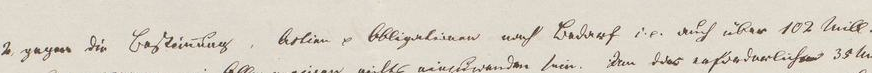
2. gegen die Bestimmung, Actien & Obligationen nach Bedarf i. e. auch über 102 Mill.
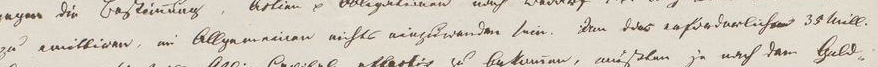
zu emittiren, im Allgemeinen nichts einzuwenden sein. Um die erforderlichen 35 Mill.
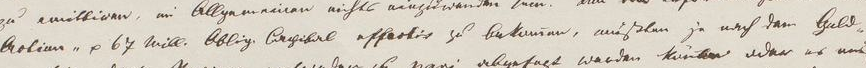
Actien- & 67 Mill. Oblig. Capital effectiv zu bekommen, müßten je nach dem Geld-
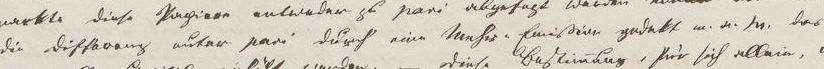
die Differenz unter pari durch eine Mehr-Emißion gedekt m. a. W. das
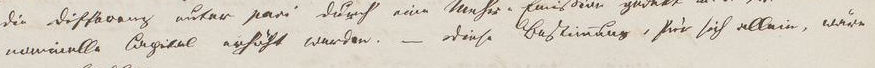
nominelle Capital erhöht werden. – Diese Bestimmung, für sich allein, wäre
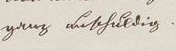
ganz unschuldig.
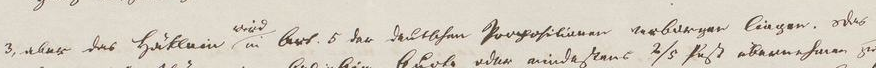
3. aber das Häklein wird in Art. 5 der deutschen Propositionen verborgen liegen. Das
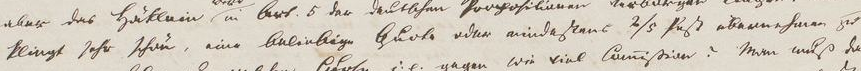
klingt sehr schön, eine beliebige Quote oder mindestens ⅖ fest übernehmen zu
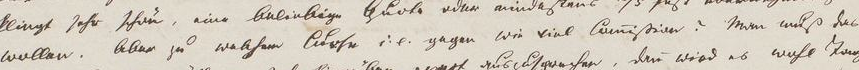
wollen. Aber zu welchem Curse i. e. gegen wie viel Commißion? Man muß das
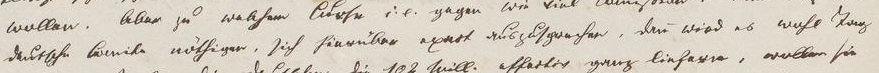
deutsche Comite nöthigen, sich hierüber exact auszusprechen, dann wird es wohl Tag
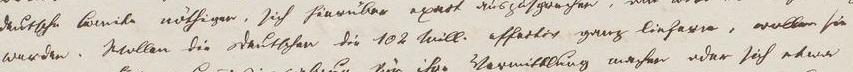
werden. Wollen die Deutschen die 102 Mill. effectiv ganz liefern, wollen sie
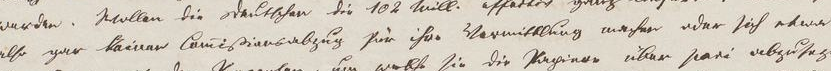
also gar keinen Commißionsabzug für ihre Vermittlung machen oder sich etwa
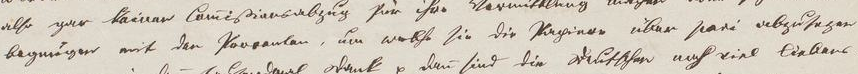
begnügen mit den Procenten, um welche sie die Papiere über pari abzusezen
